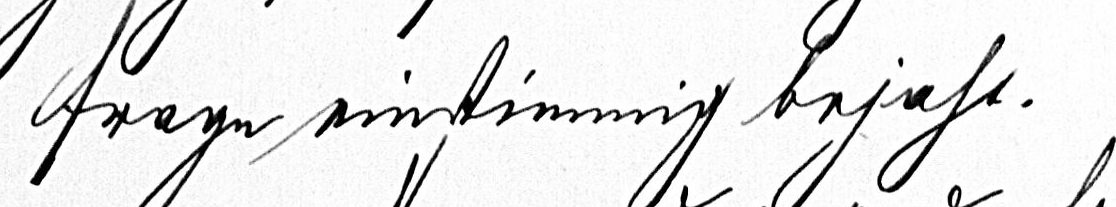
frage einstimmig bejaht.
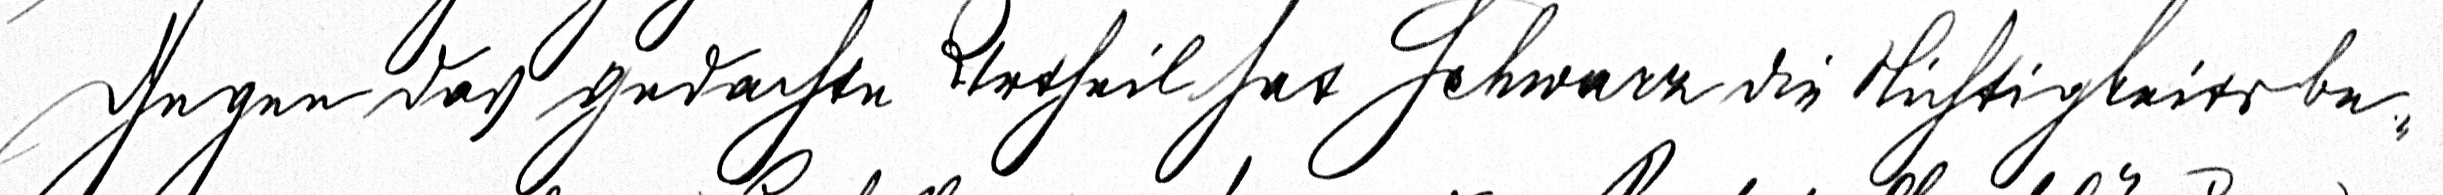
Gegen das gedachte Urtheil hat Schwarz die Nichtigkeitsbe¬
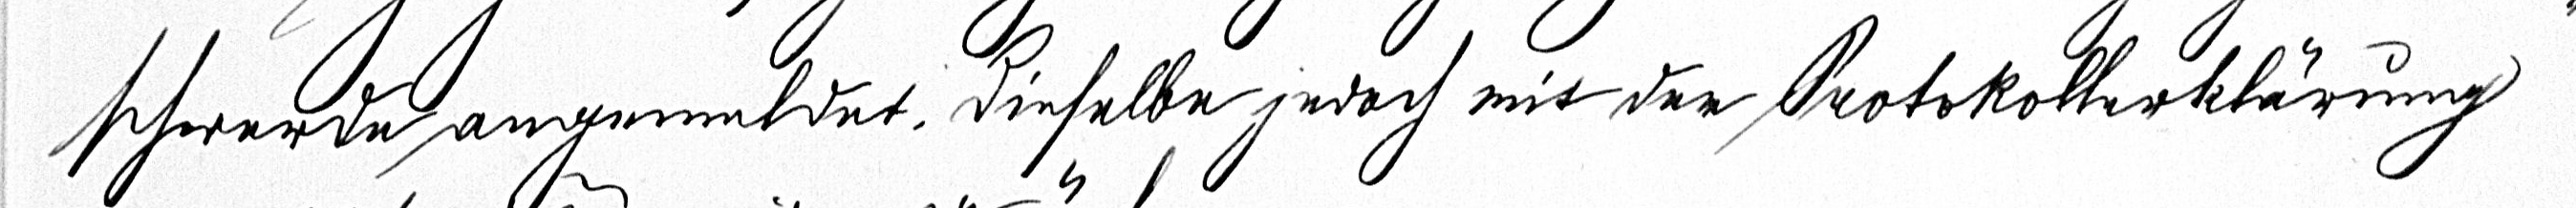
schwerde angemeldet. Dieselbe jedoch mit der Protokollerklärung
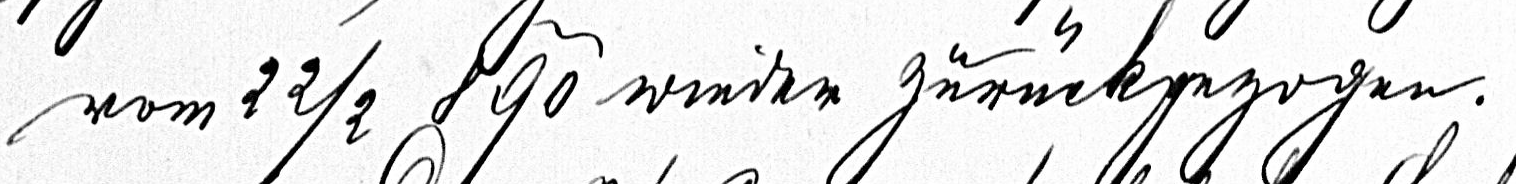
vom 22/2 890 wieder zurückgezogen.
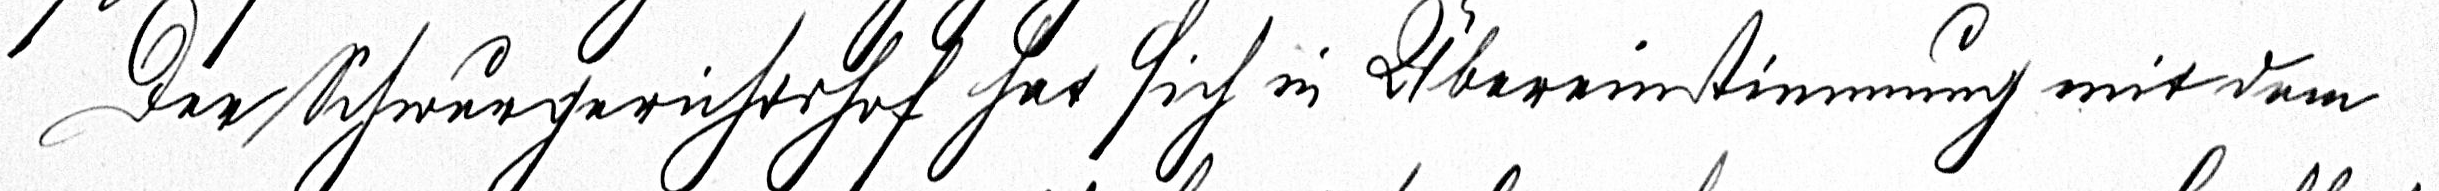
Der Schwurgerichoshof hat sich in Übereinstimmung mit dem
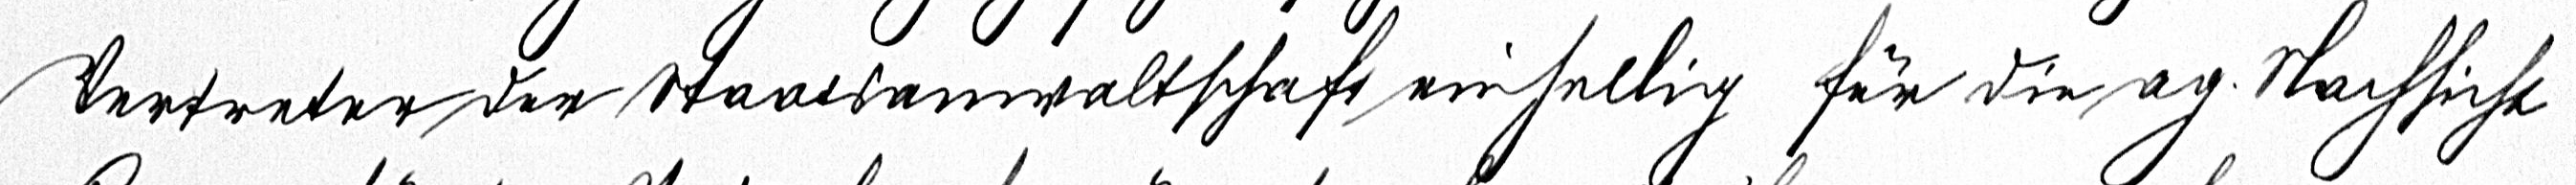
Vertreter der Staatsanwaltschaft einhellig für die ag. Nachsicht
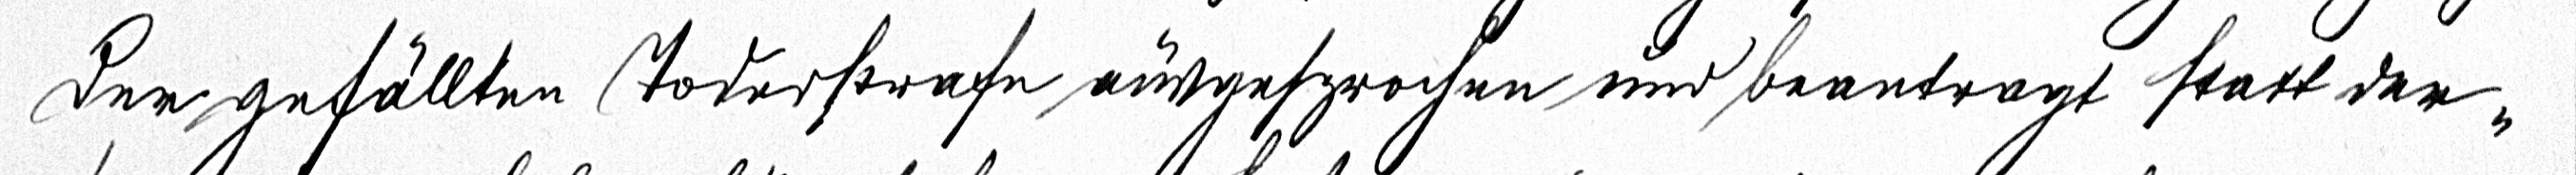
der gefällten Todesstrafe ausgesprochen und beantragt statt der¬
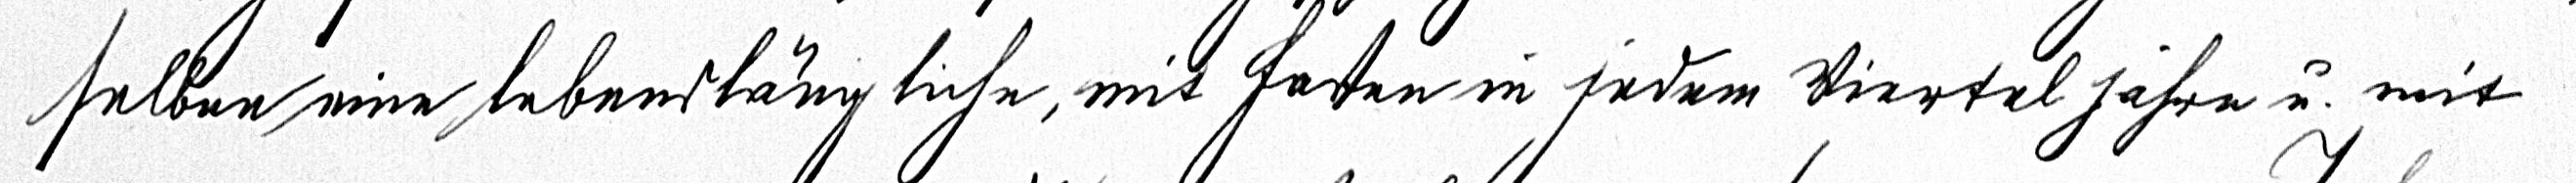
selben eine lebenslängliche, mit Harten in jedem Vierteljahre u. mit
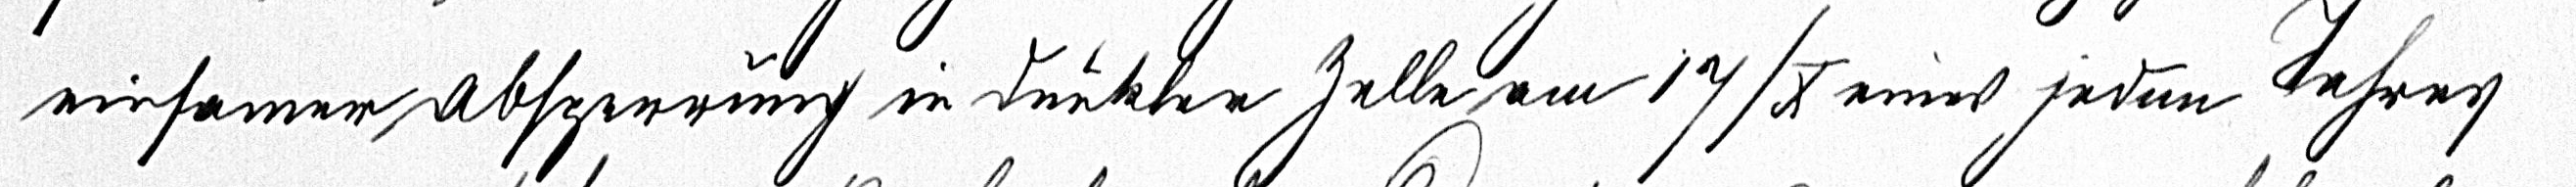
einsamer Absperrung in dunkler Zelle am 17/X eines jedem xxahres
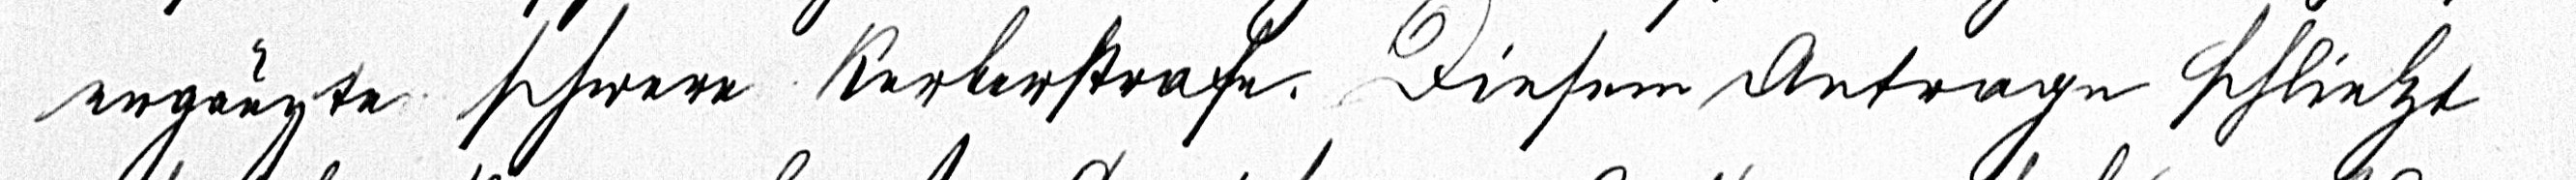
ergänzte schwere Kerkerstrafe. Diesem Antrage schließt
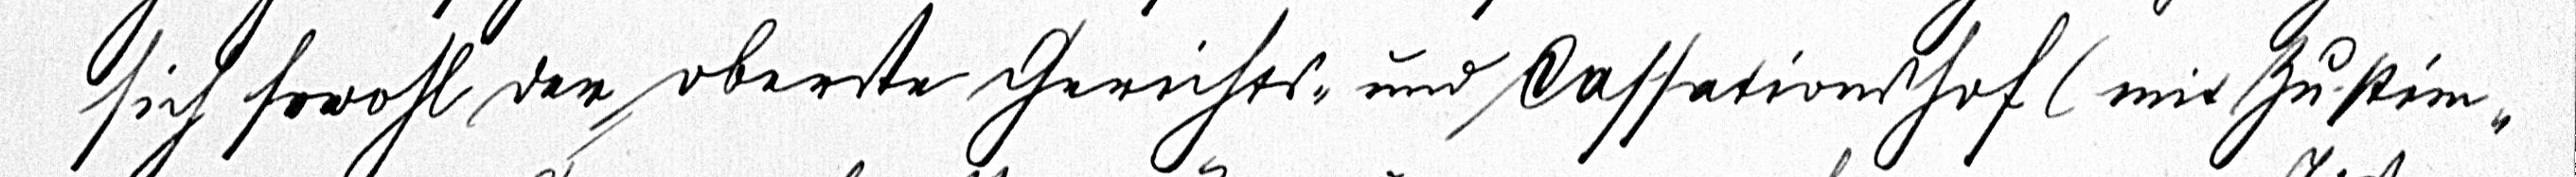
sich sowohl der oberste Gerichts- und Cassationshof (mit Zustim¬
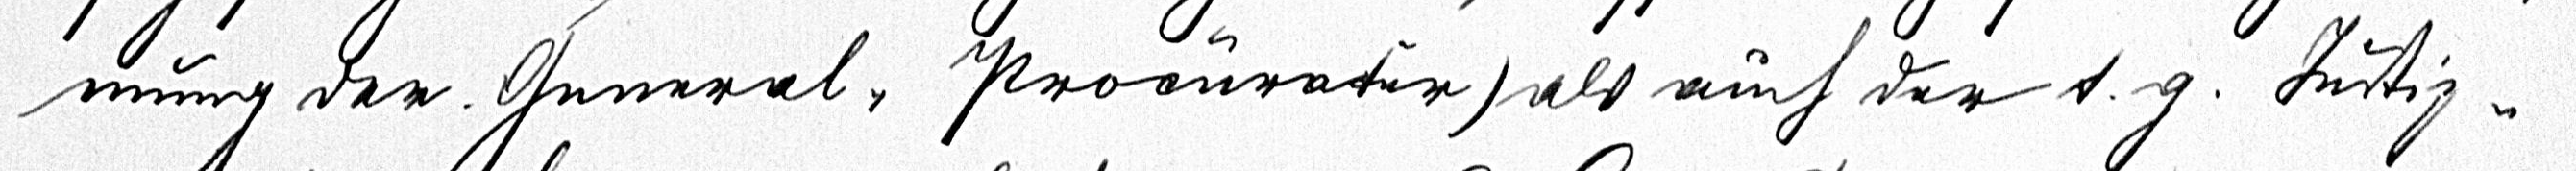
mung der General, Procuratur) als auch der xx g. Justiz¬
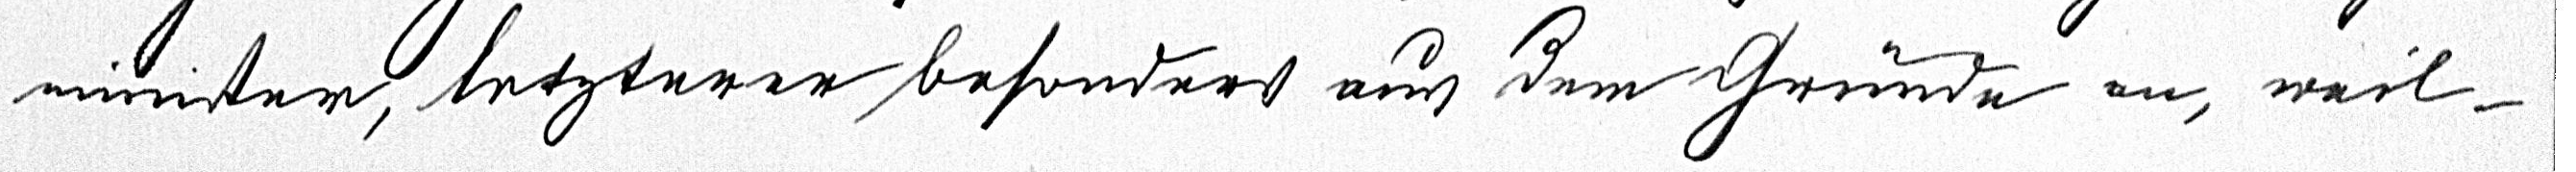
minister, letzterer besonders aus dem Gründe an, weil-
